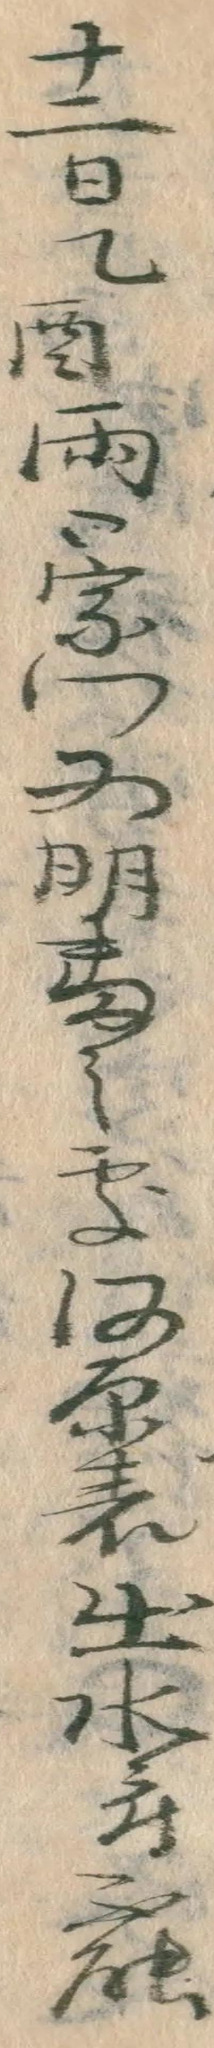十二日乙酉雨御家門為明番之處河原表出水ニ付不能
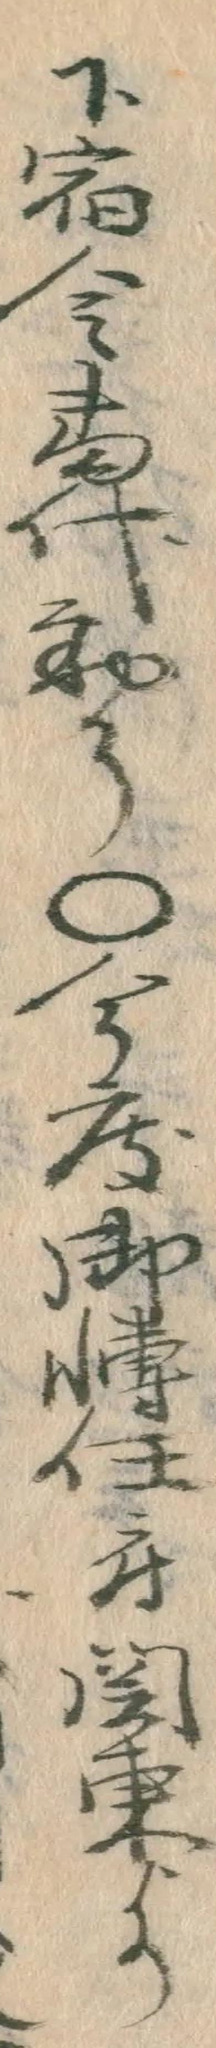下宿令番代勤了○今度御轉任ニ付関東より
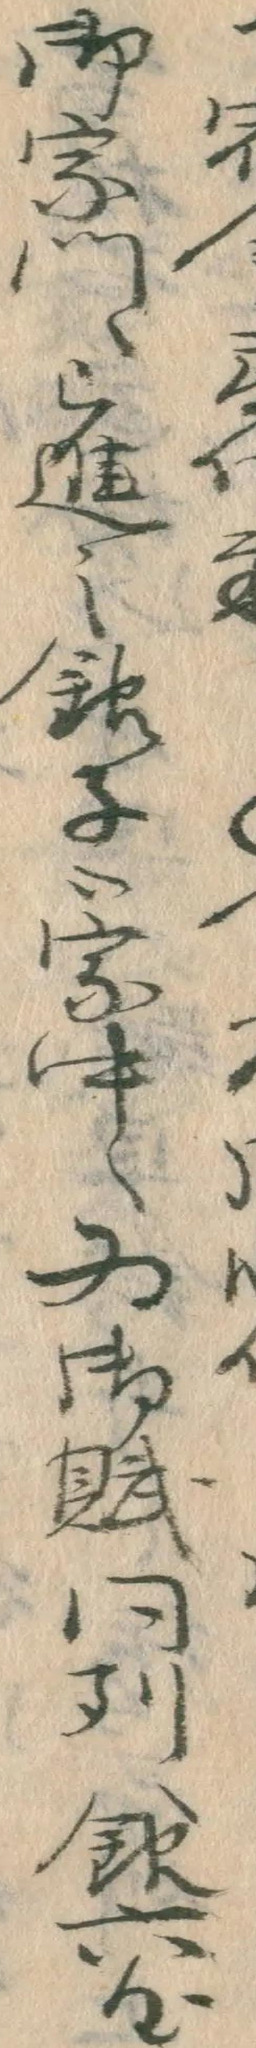御家門へ被進之銀子御家中へ為御賦同列銀六匁
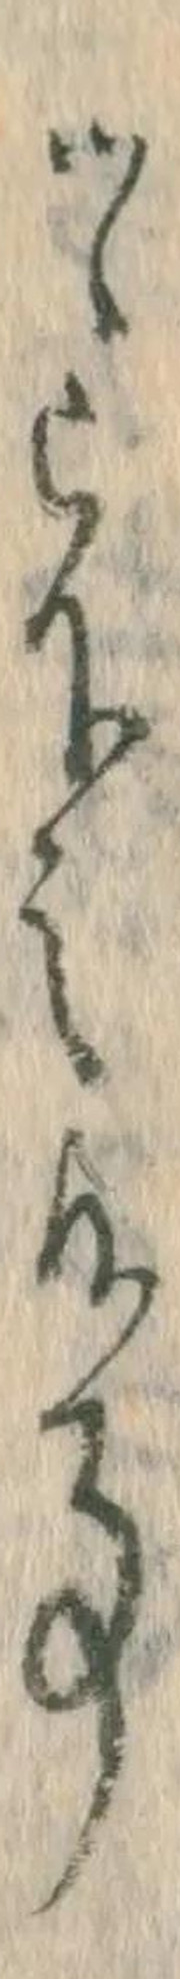ツヽ被下之候事
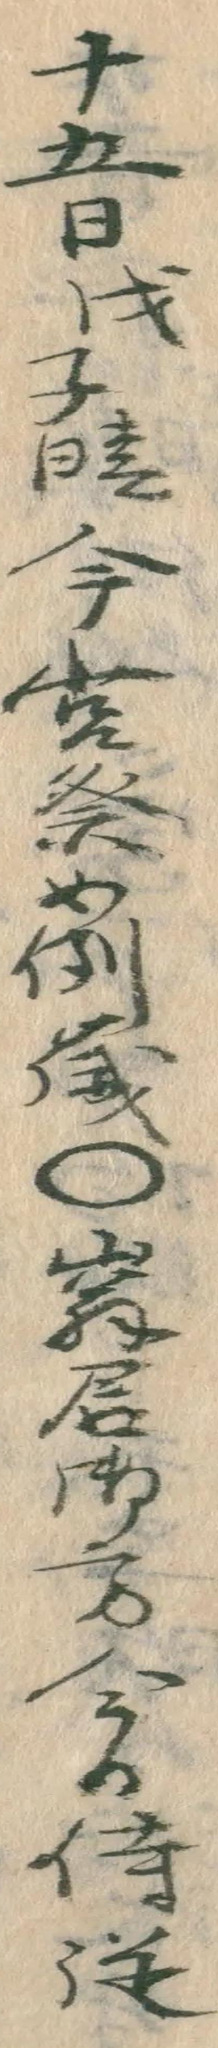十五日戊子晴今宮祭如例儀○嵡君御方今日侍従
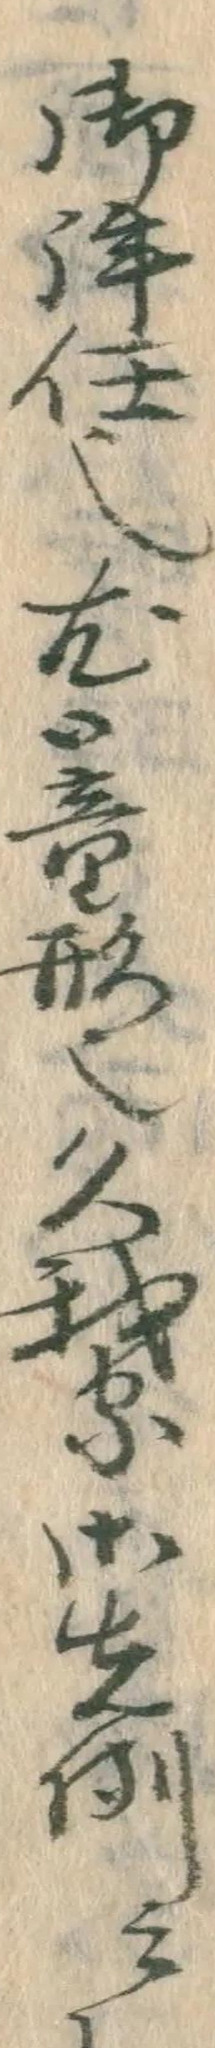御拝任也尤御童形也久我家御先例云々
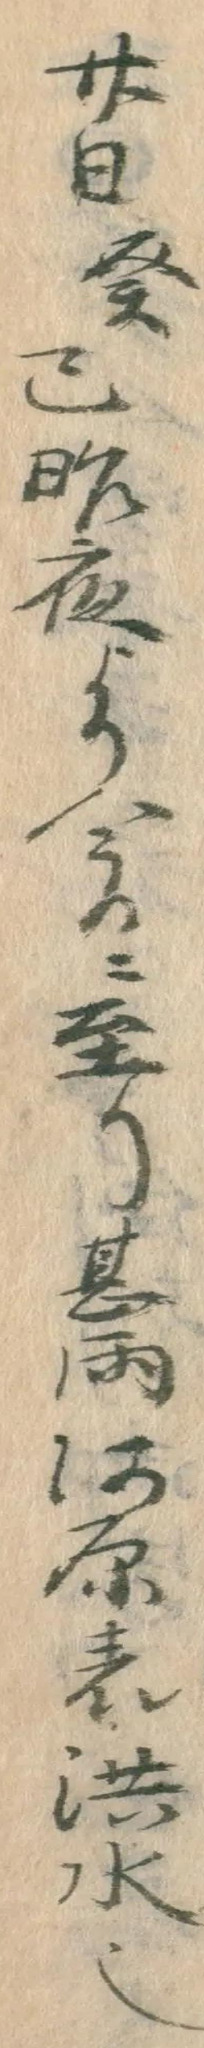廿日癸巳昨夜より今日に至り甚雨河原表洪水也

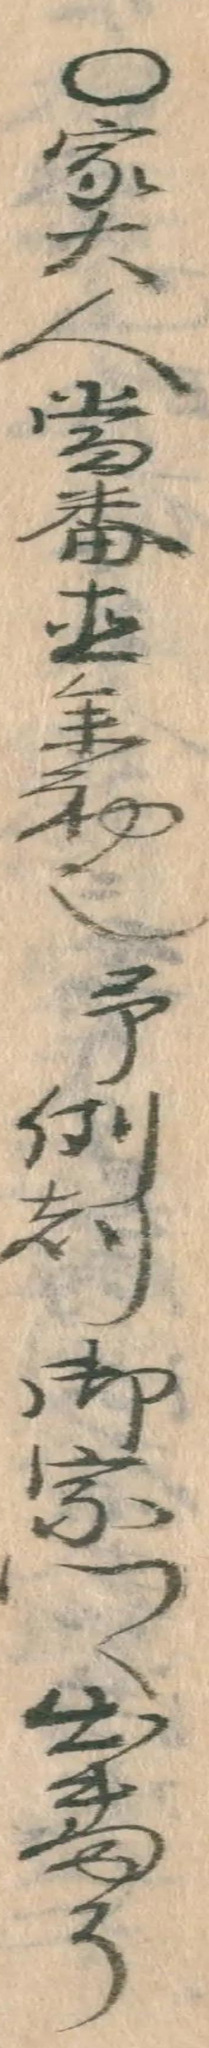○家大人當番直参初也予例刻御家門へ出番了
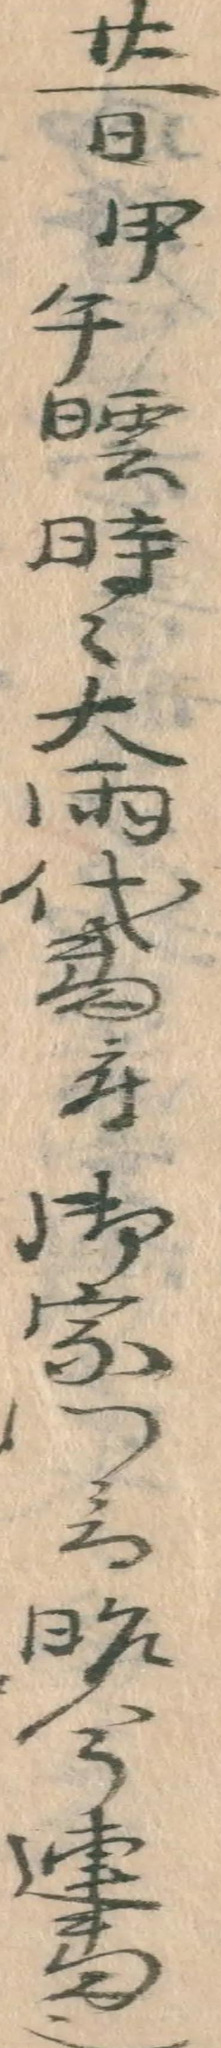廿一日甲午曇時々大雨代番ニ付御家門ニ而昨今連番也
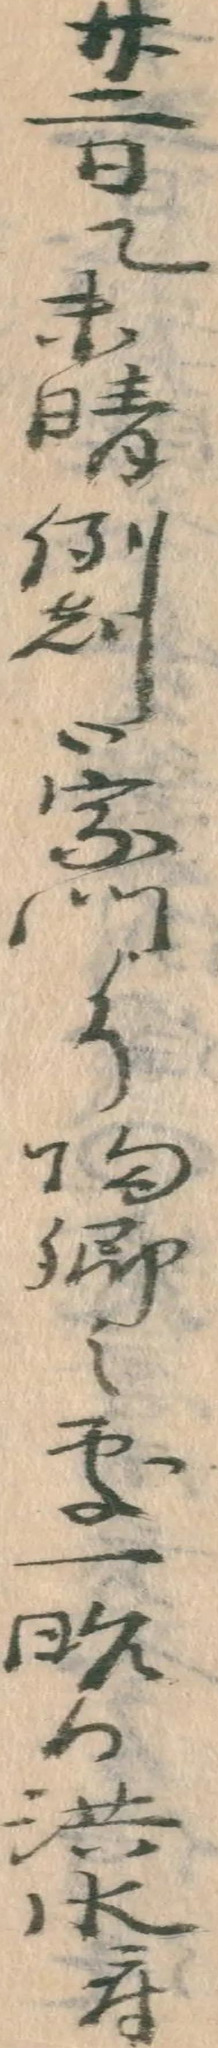廿二日乙未晴例刻御家門より帰郷之處一昨日洪水ニ付
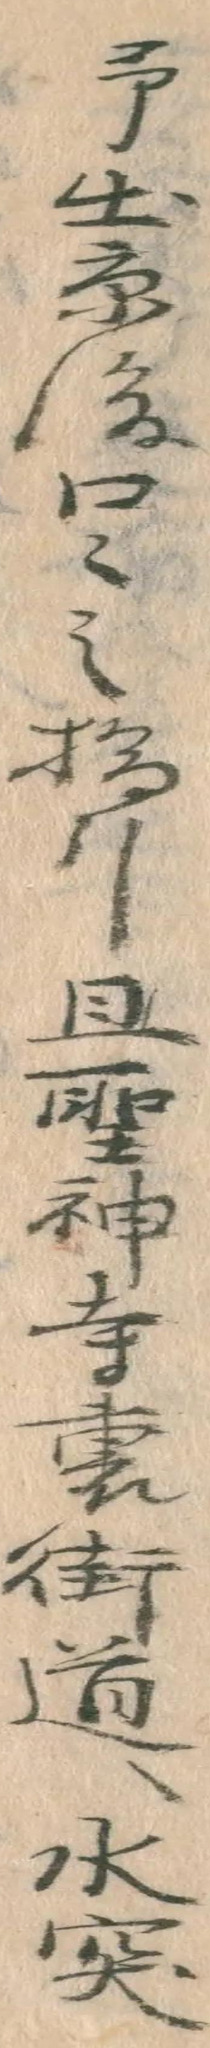予出京後口〻之橋引且聖神寺裏街道へ水突
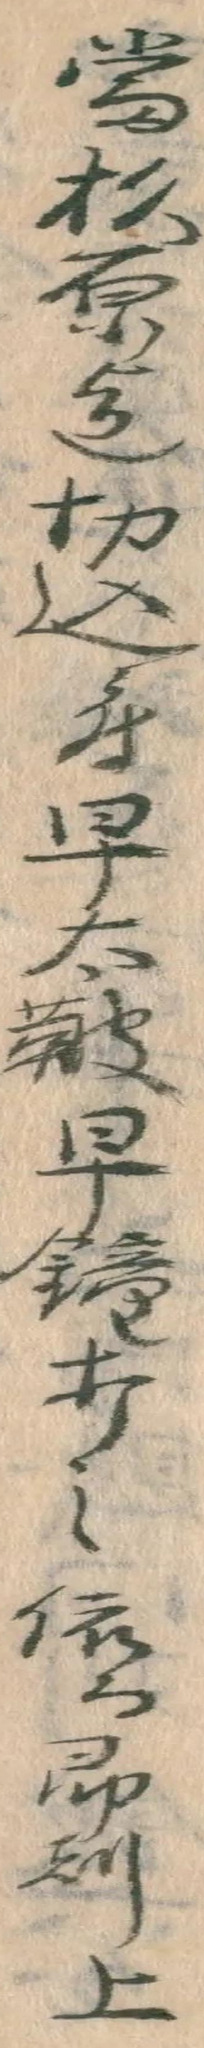當杉原迄切込ニ付早太鼓早鐘打之依而即刻上
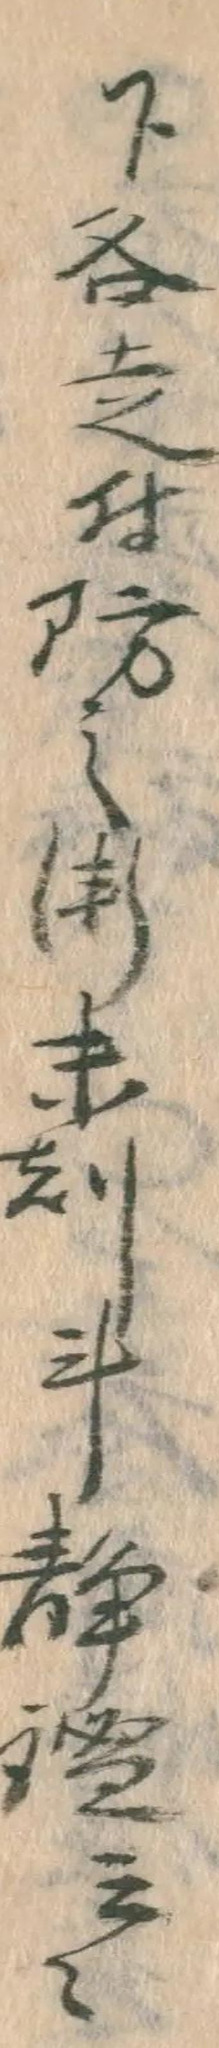下各走付防之漸未刻計静謐云々
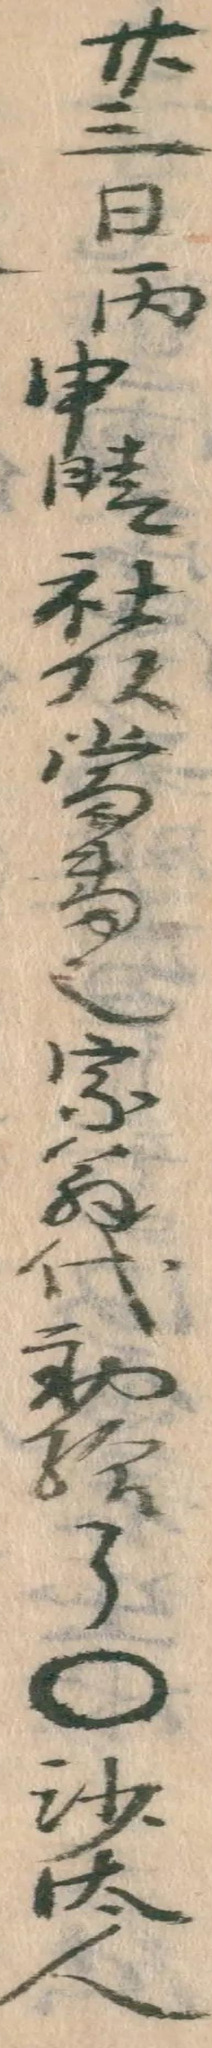廿三日丙申晴社頭當番也家翁代勤給了○沙汰人
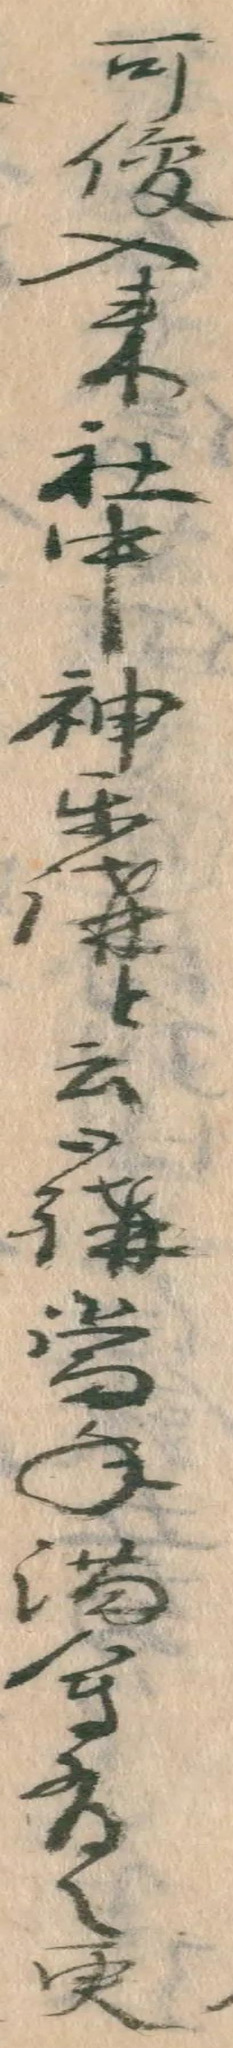可俊入来社中神楽講と云御講唐當年満會有之更
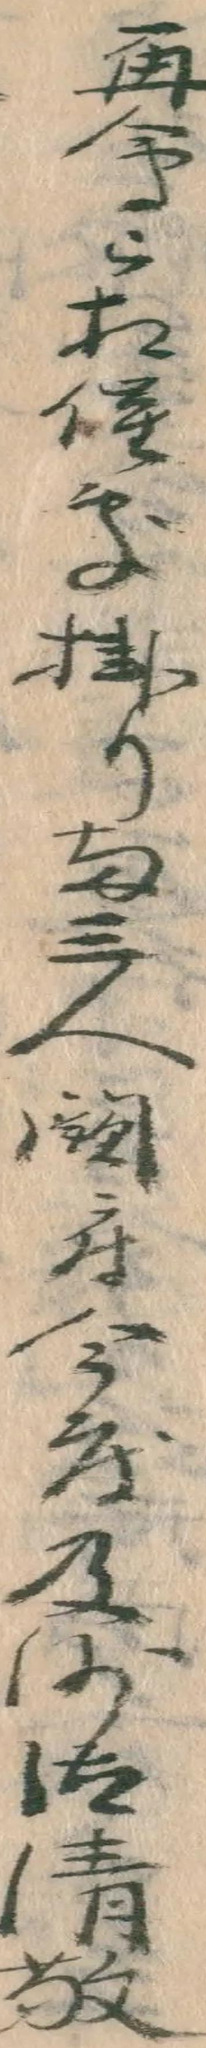再會被相催處掛り両三人闕ニ付今度及沙汰清敬
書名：賀茂社記録. 第63冊
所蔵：国立国会図書館 National Diet Library, JAPAN
